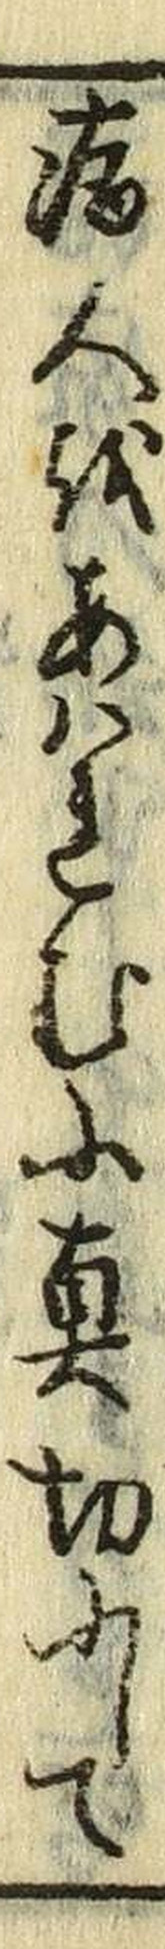病人をあはれむに真切にして
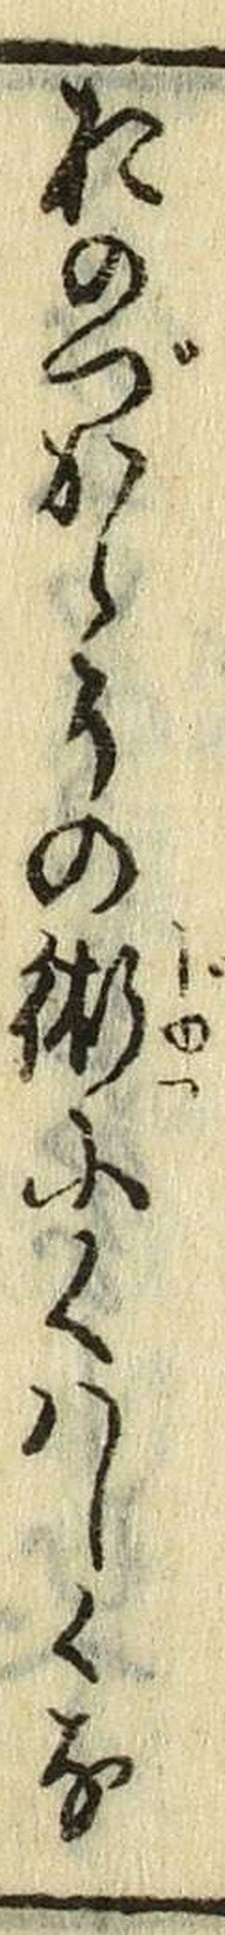おのづからその術にくはしくな
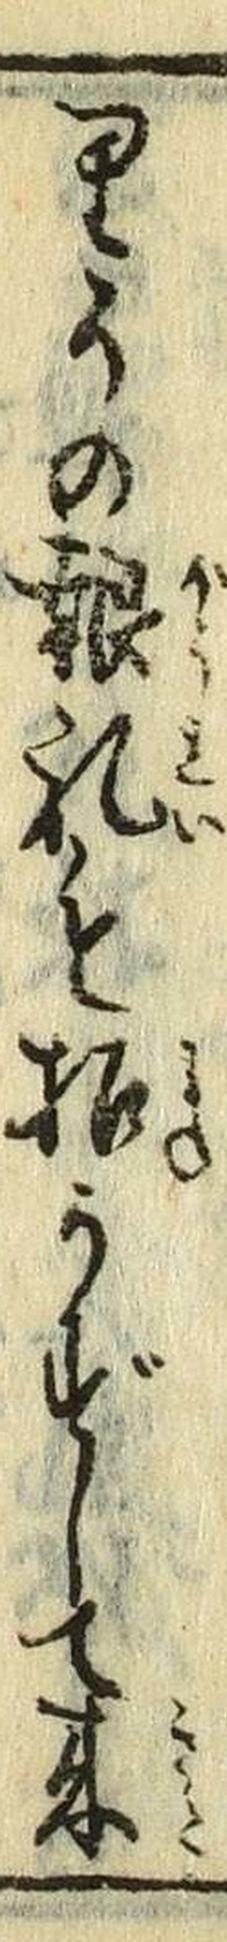りその報礼も招かずして来
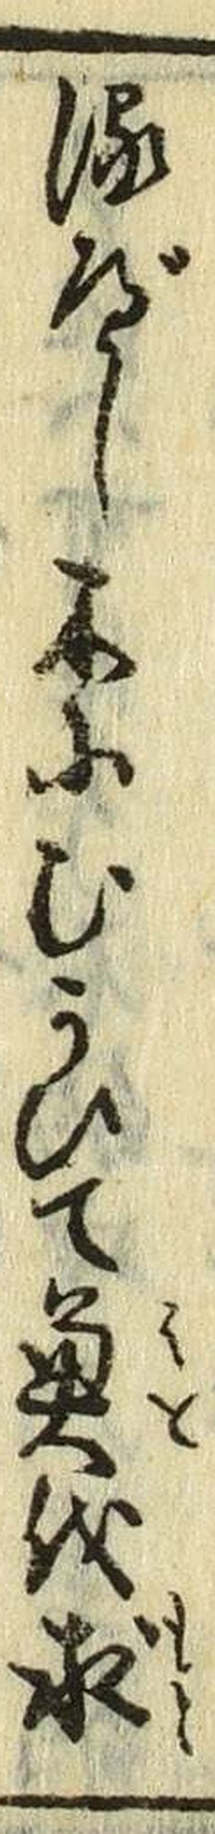るべし木にむかひて魚を求
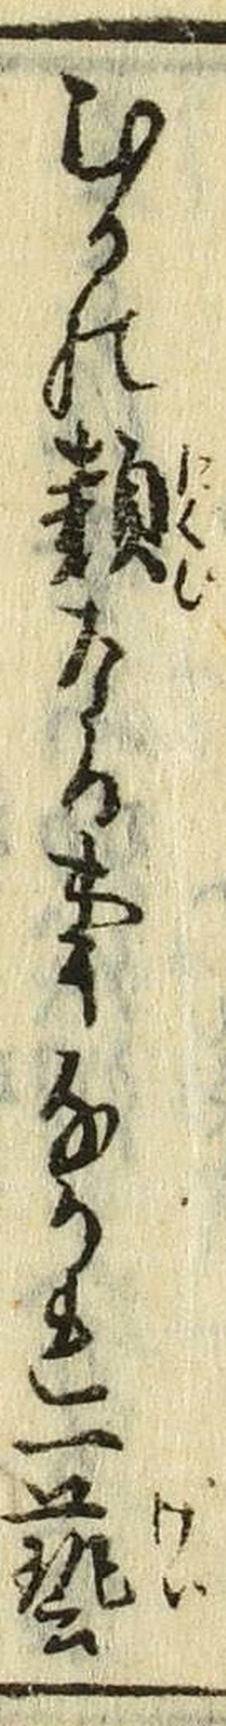むるの類なる事なかれ二芸
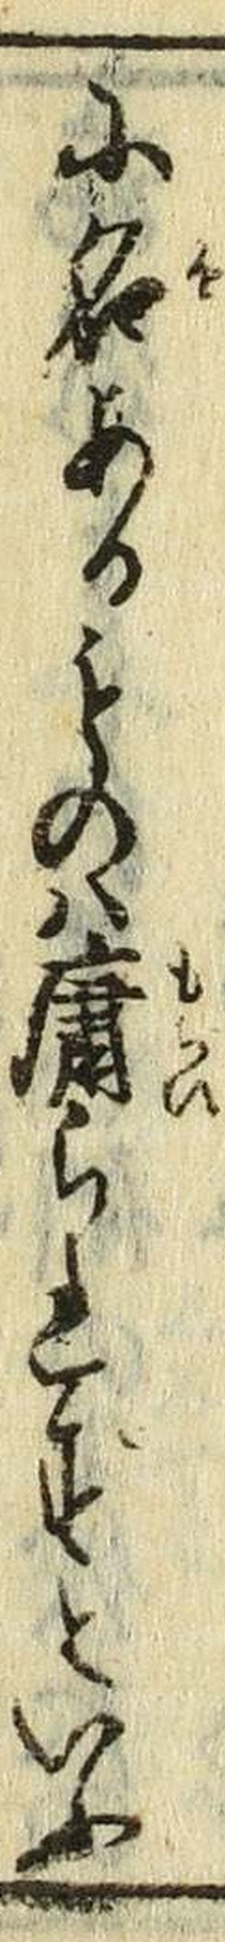に名あるものは庸られずといふ
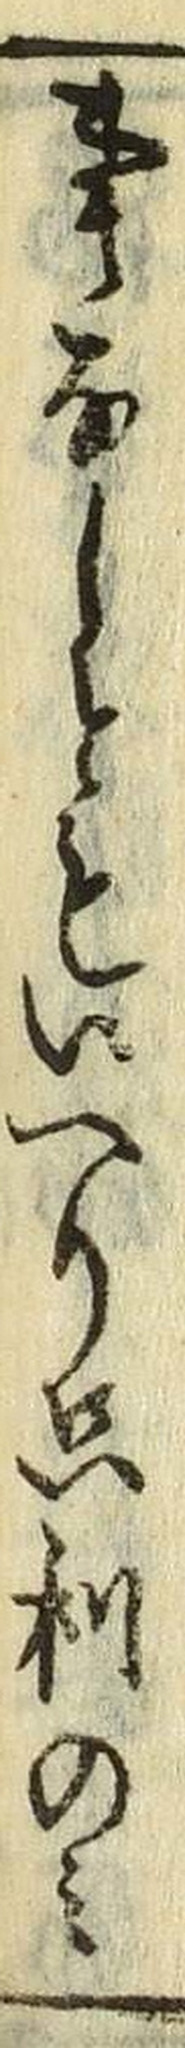事なしともいへり只利のみ
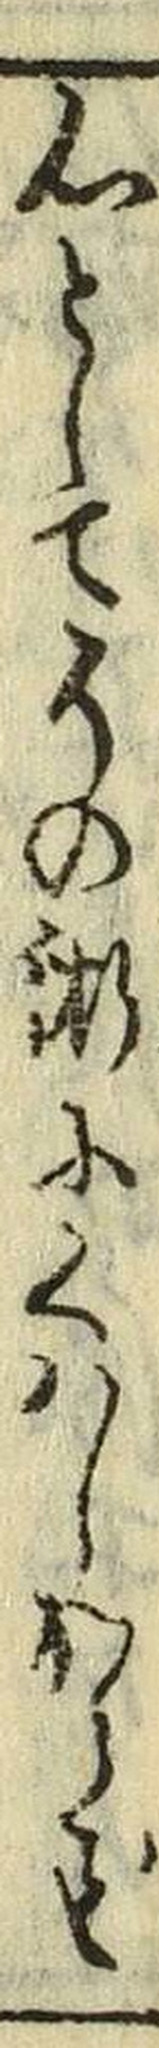心としてその術にくはしからず
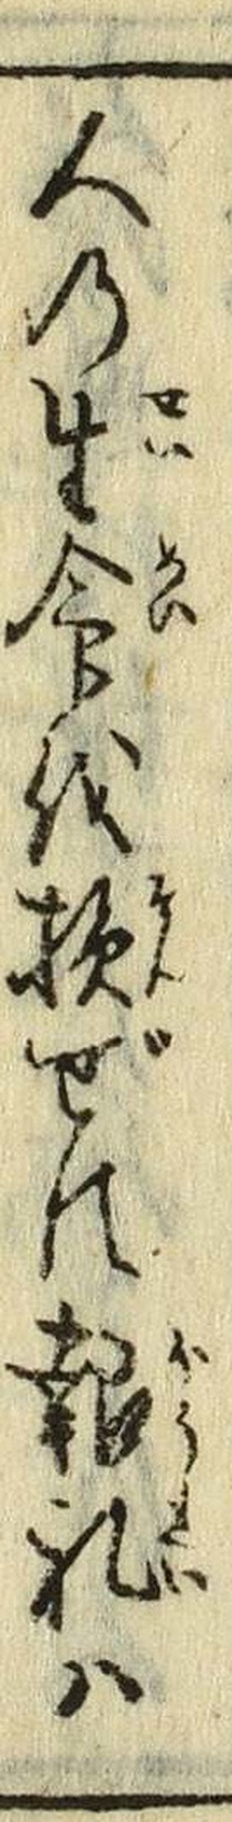人の生命を損ぜは報礼は
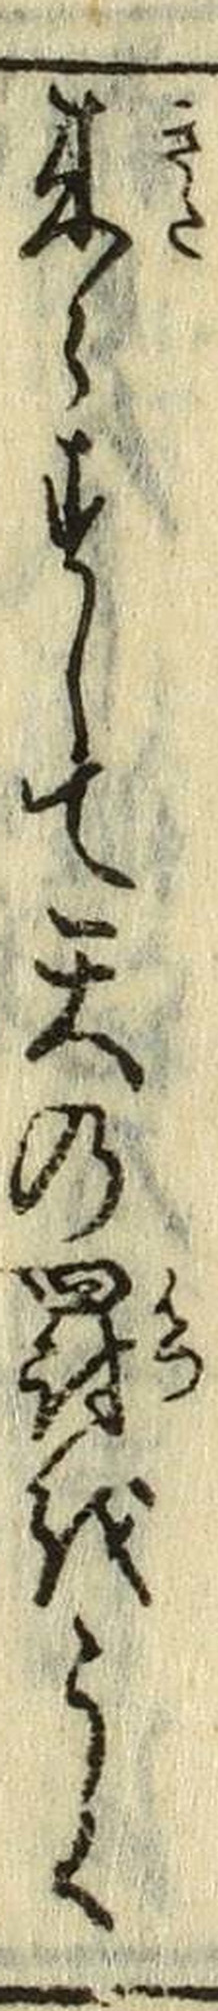来らすして天の罸をうく
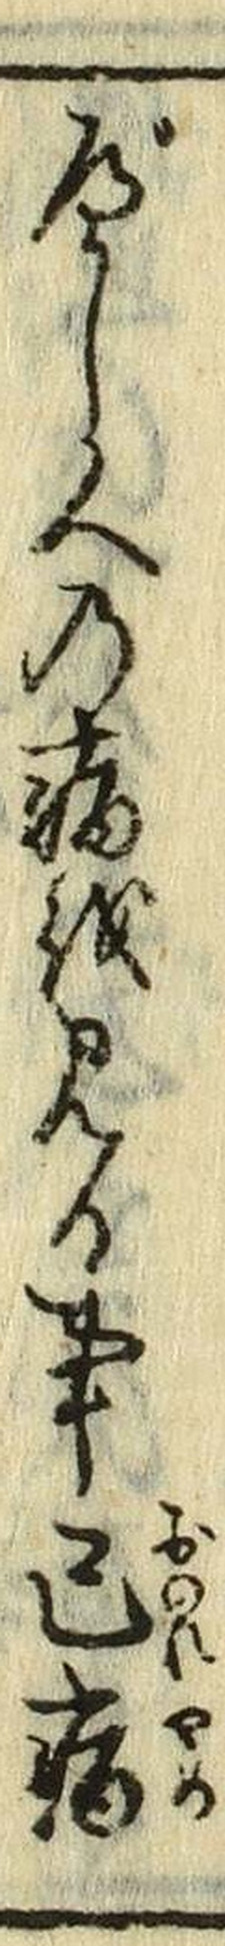べし人の病を見る事己病
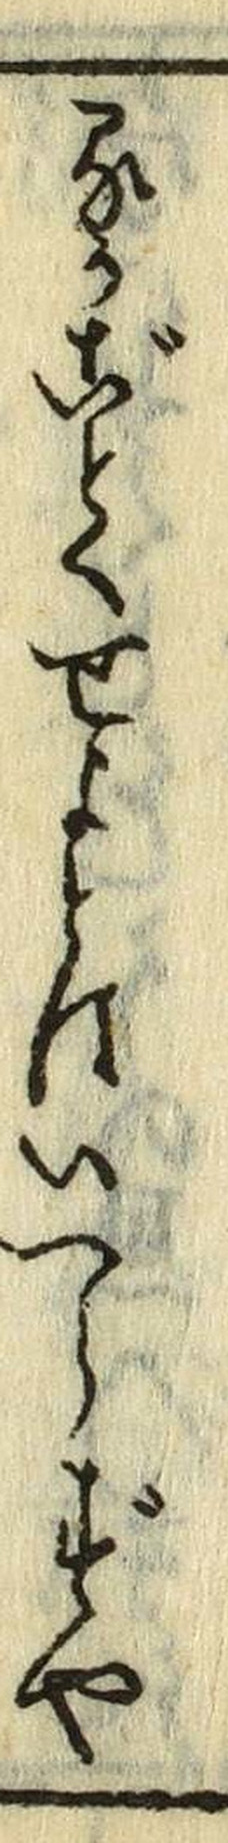るかごとくせよとはいへらずや
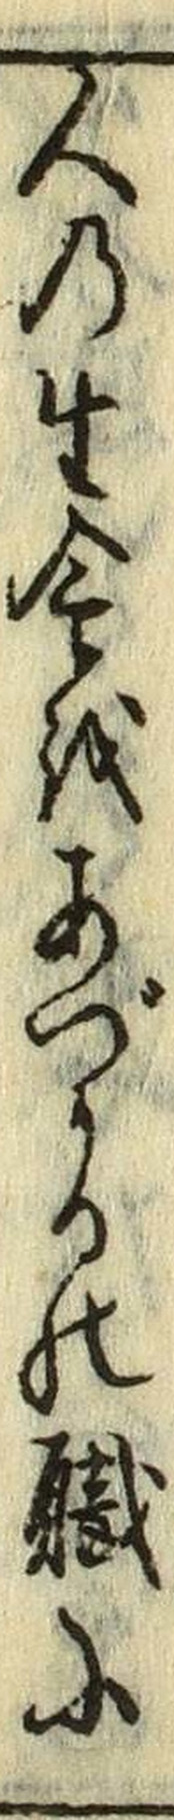人の生命をあづかるの職に
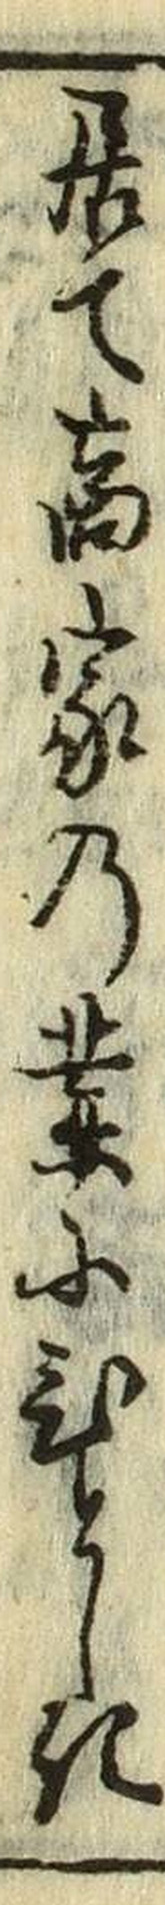居て商家の業にひとしき
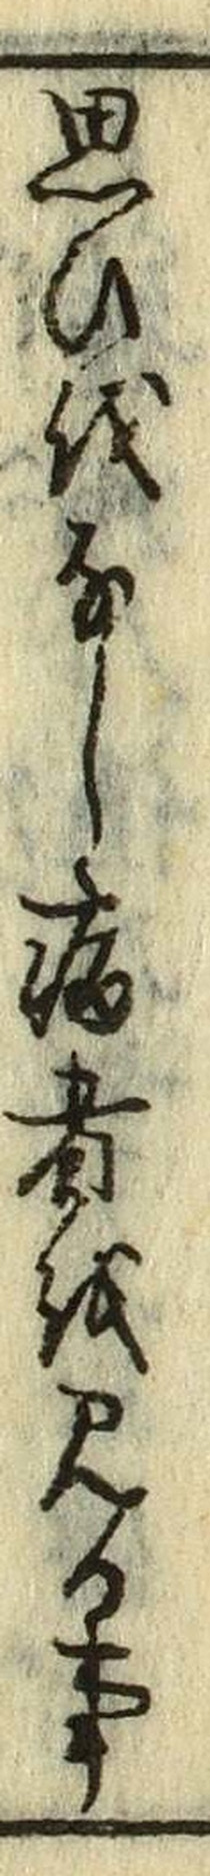思ひをなし病者を見る事
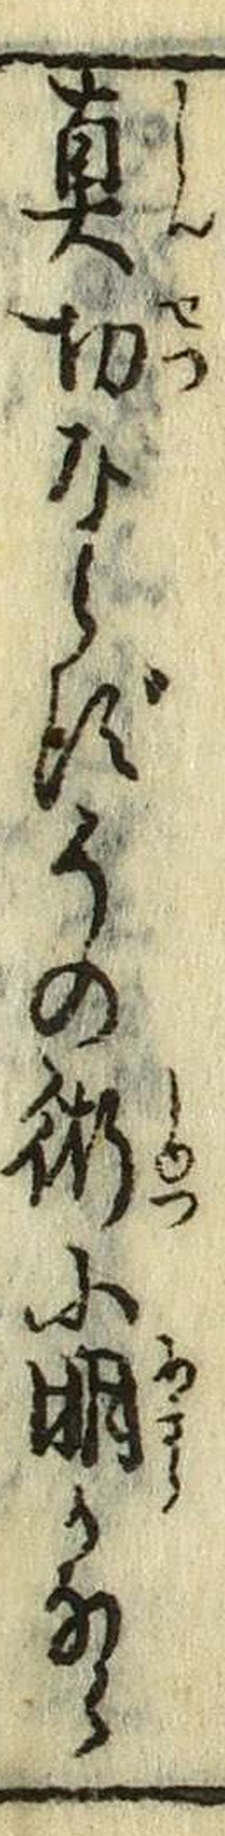真切ならずその術に明かなら
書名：居家養生記
